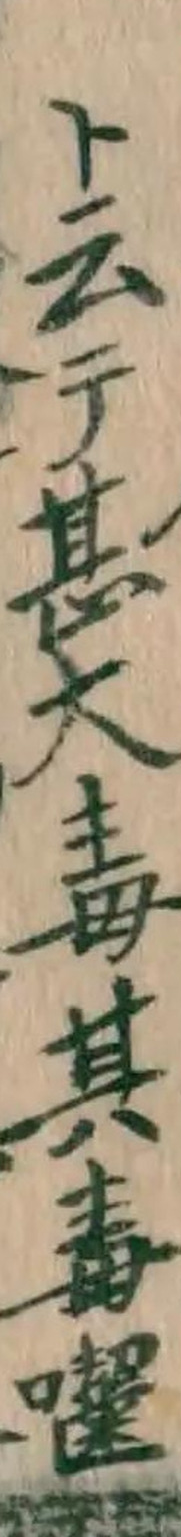ト云テ甚大毒其毒囓
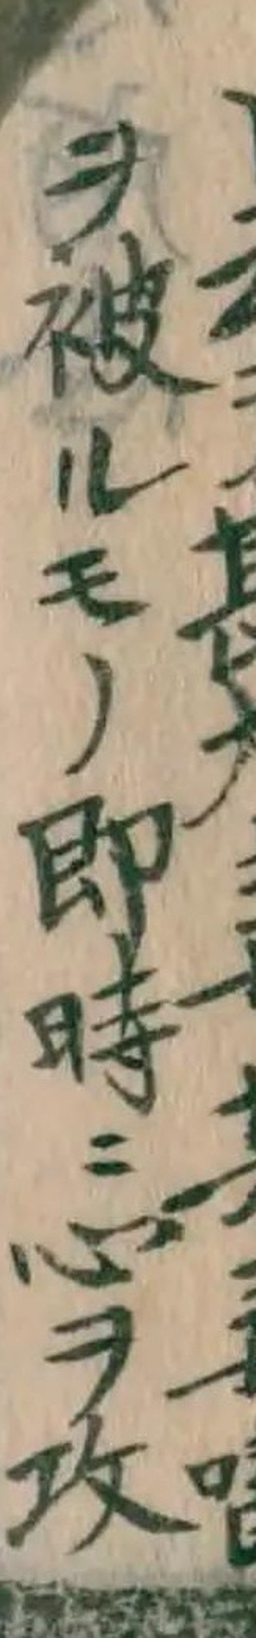ヲ被ルモノ即時ニ心ヲ攻
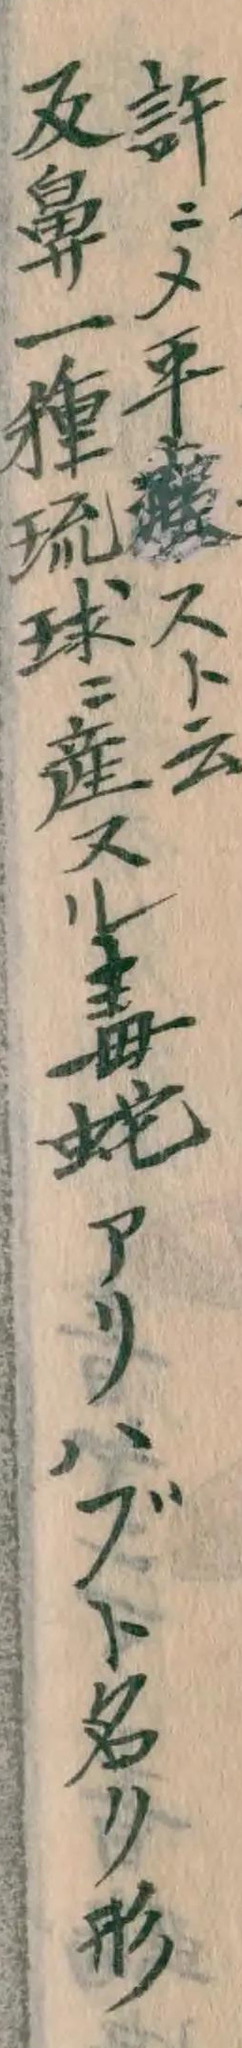反鼻一種琉球ニ産スル毒蛇アリハブト名ク形
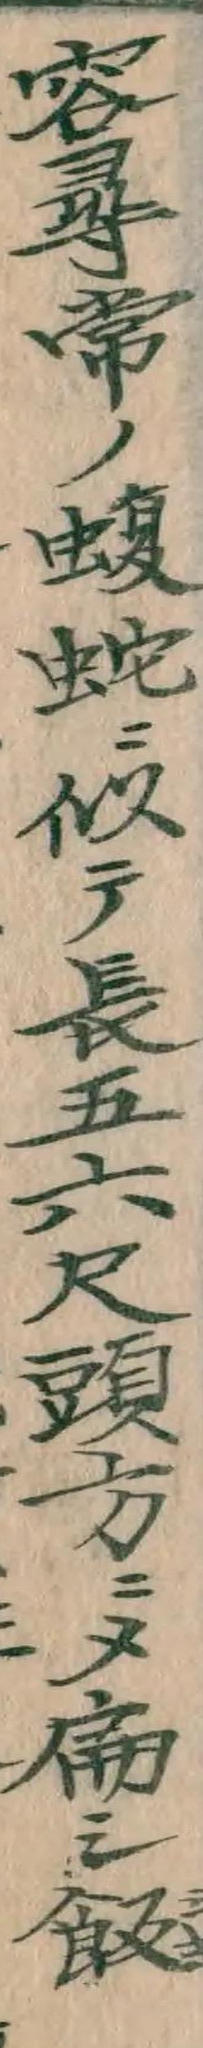容尋常ノ蝮蛇ニ似テ長五六尺頭方ニシテ扁シ飯
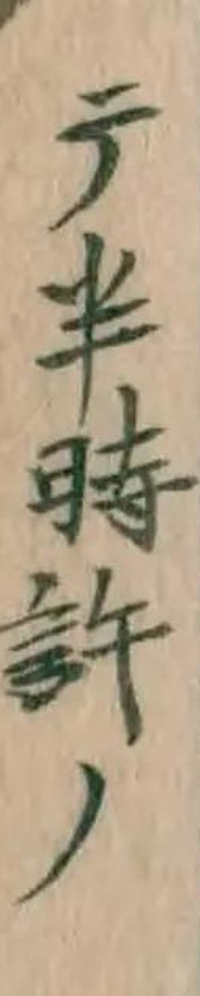テ半時許ノ
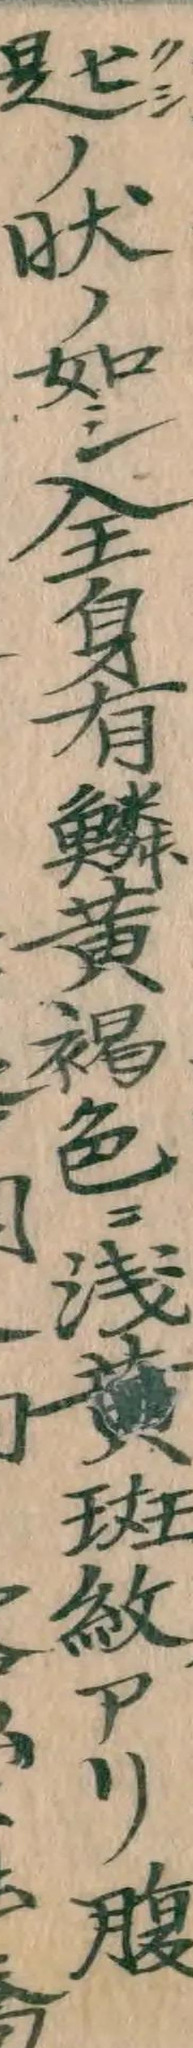匙ノ状ノ如シ全身有鱗黄褐色ニ浅斑紋アリ腹
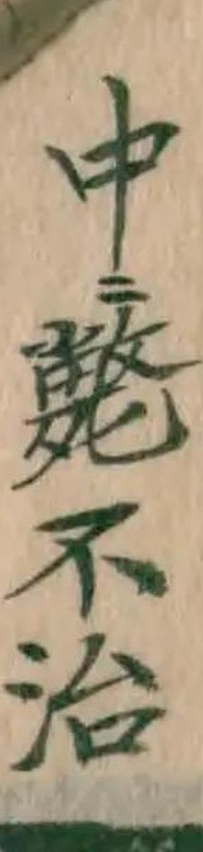中ニ斃不治
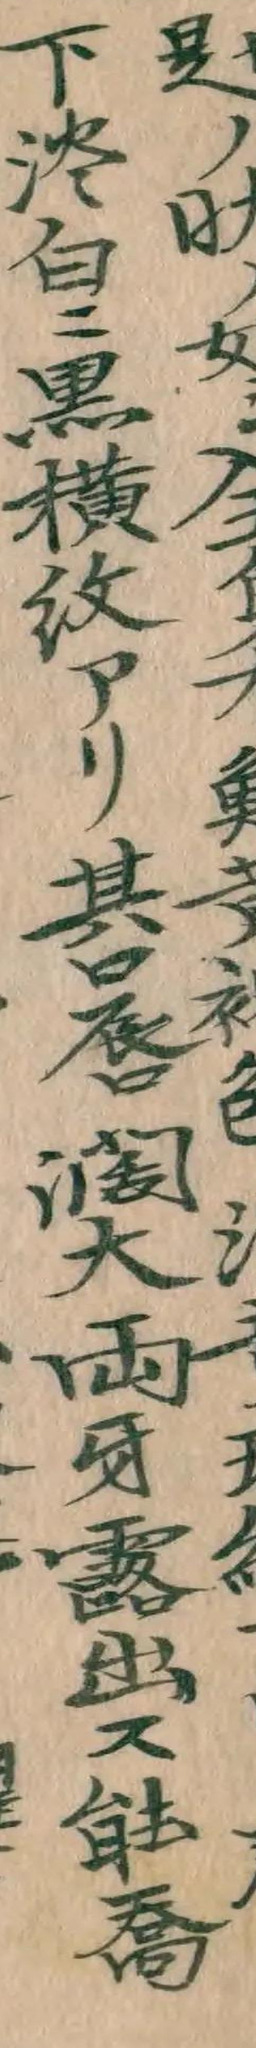下淡白ニ黒横紋アリ其口唇濶大両牙露出ス能喬
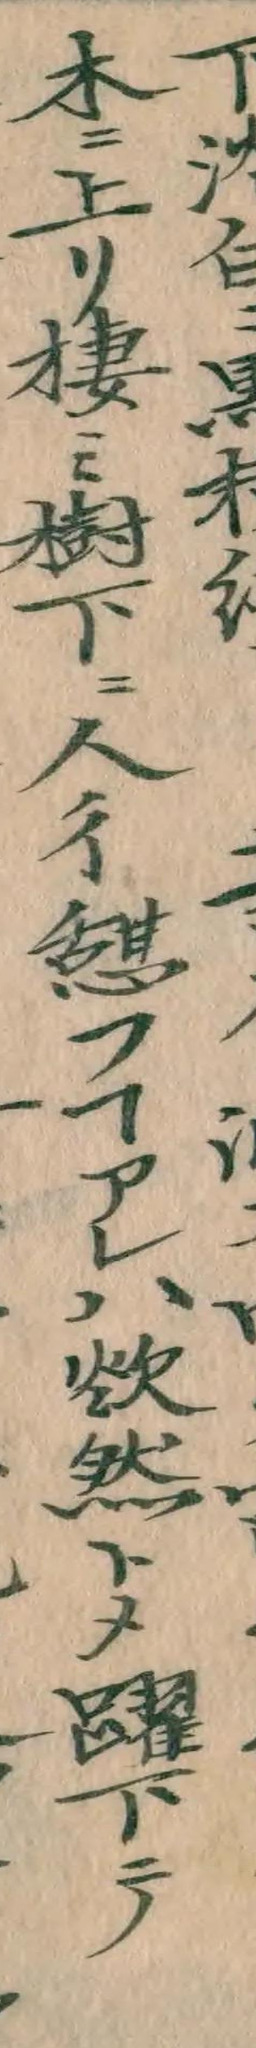木ニ上リ棲ミ樹下ニ人彳憩フコトアレハ欻然トシテ躍下テ
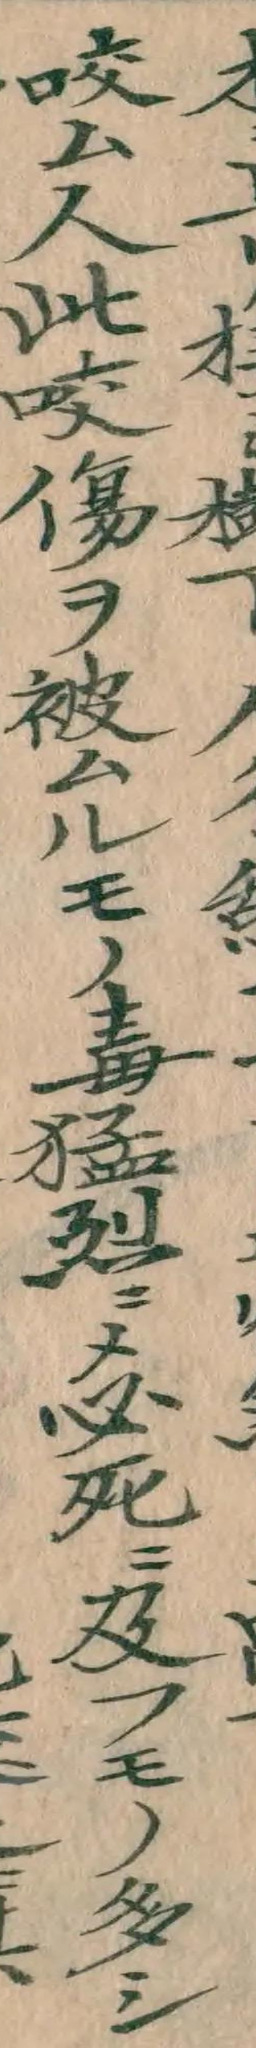咬ム人此咬傷ヲ被ムルモノ毒猛烈ニシテ必死ニ及フモノ多シ
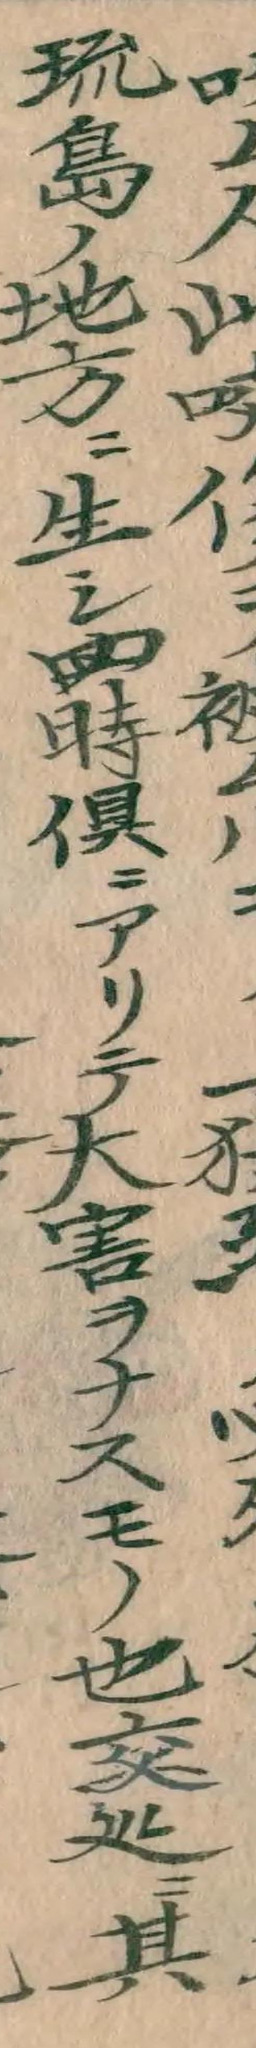琉島ノ地方ニ生シ四時倶ニアリテ大害ヲナスモノ也交処ニ其
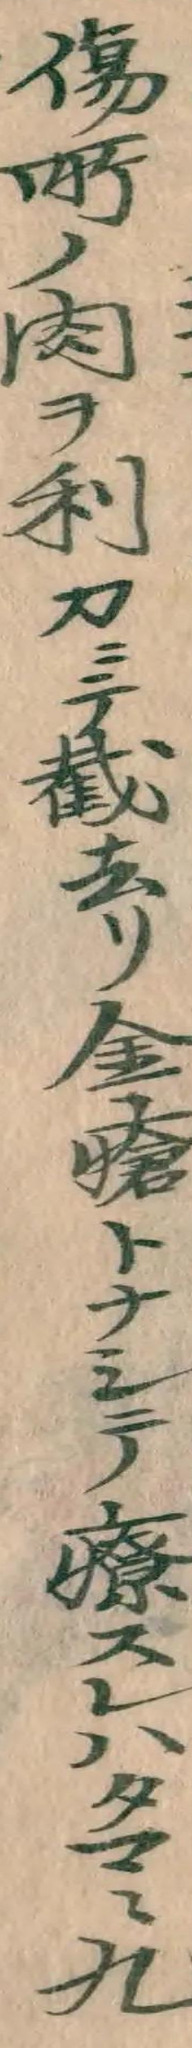傷所ノ肉ヲ利刀ニテ截去金瘡トナシテ療スレハタマ々九
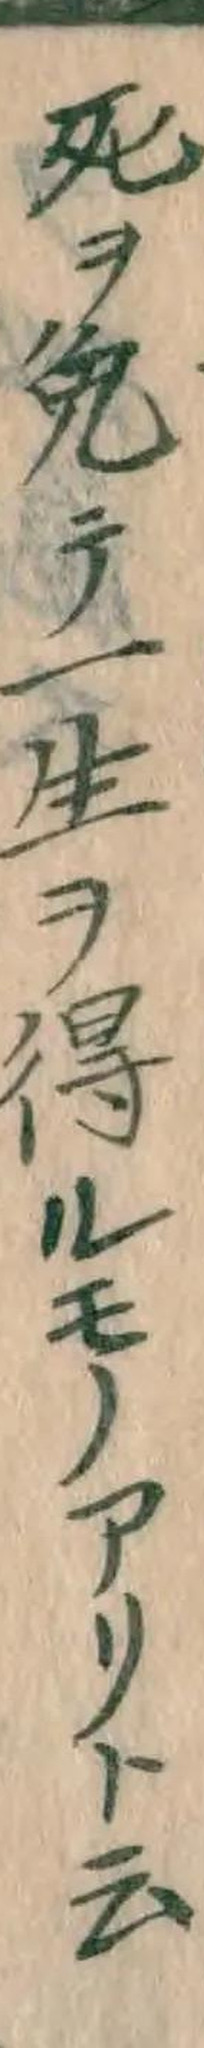死ヲ免テ一生ヲ得ルモノアリト云
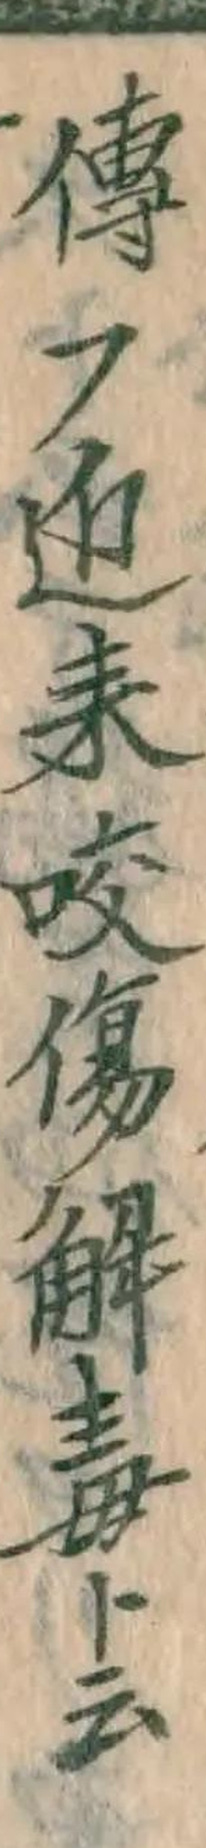伝フ近来咬傷解毒ト云
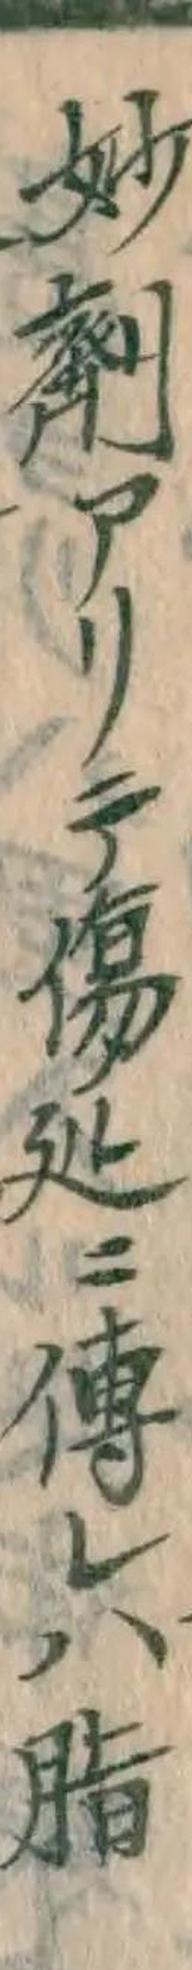妙剤アリテ傷処ニ伝レハ脂
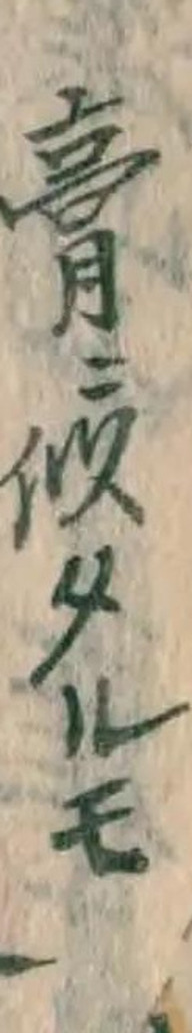膏ニ似タルモ
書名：千蟲譜 3巻. [3]
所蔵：国立国会図書館 National Diet Library, JAPAN
